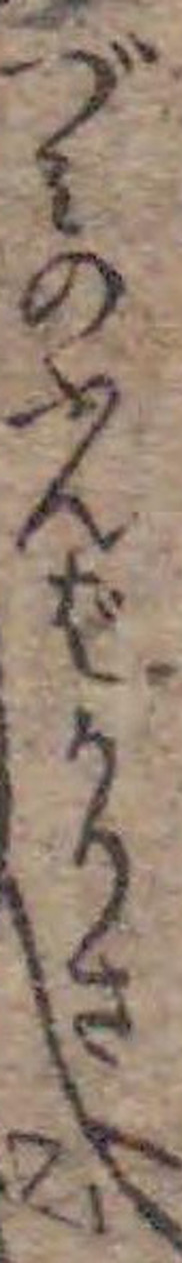づみのふんばかりさ
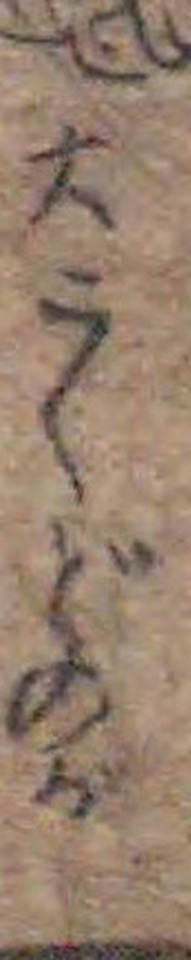大こくどのが
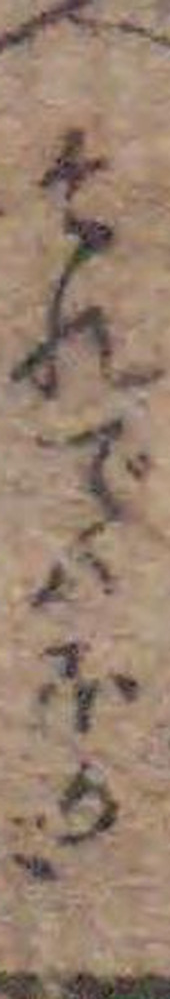それではほかに
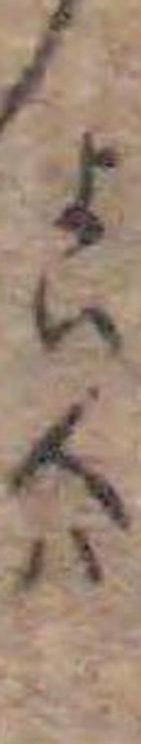よい人は
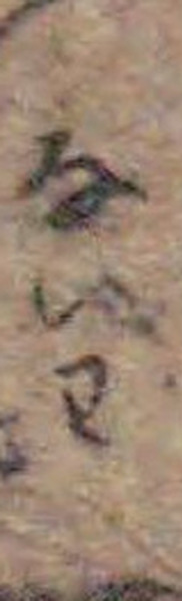ないわ
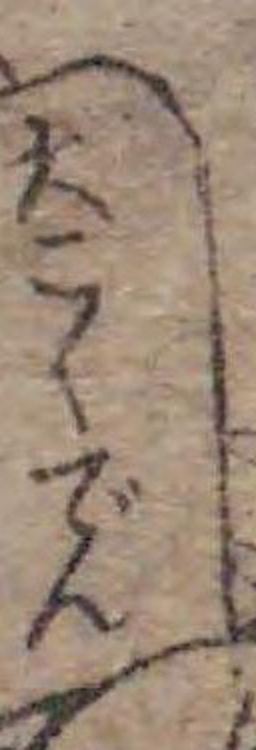大こくでん
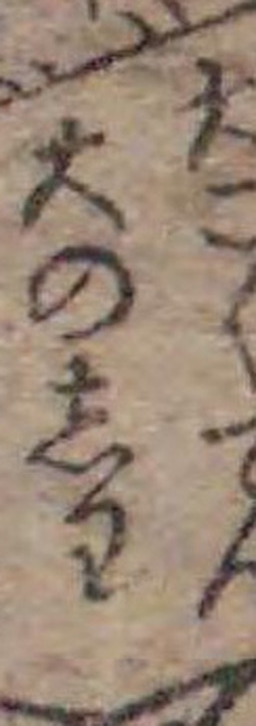大のしわ
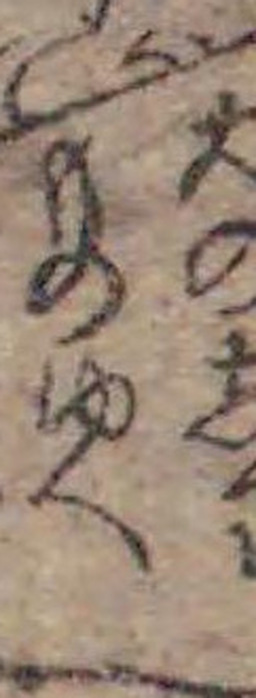ものゆへ
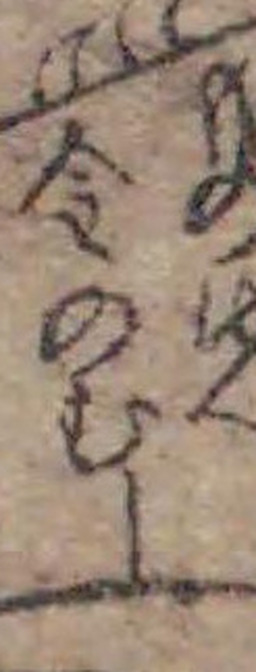金のむし
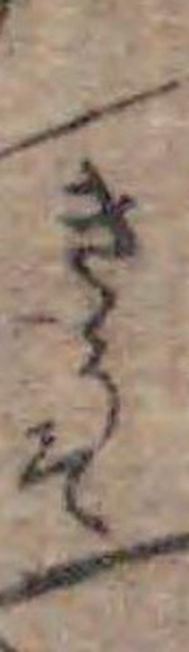きうそ

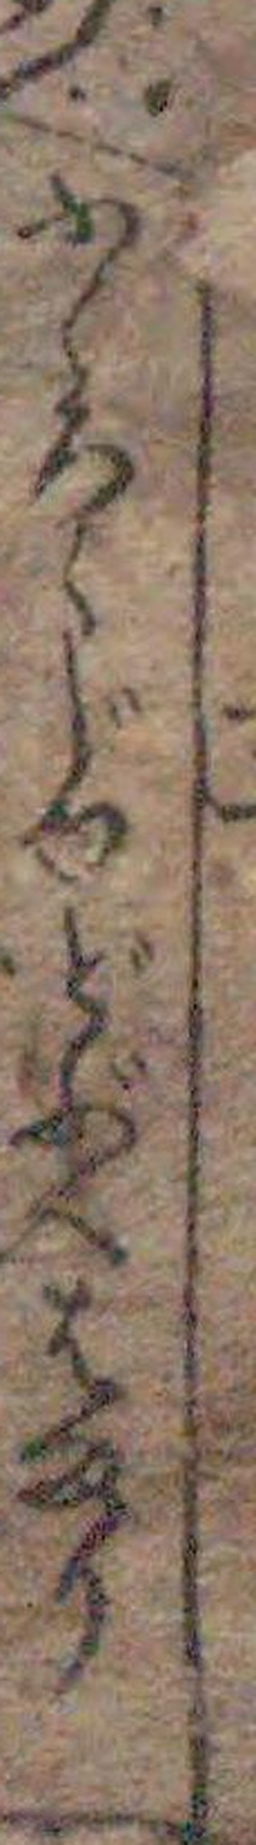ふくろくじゆどぶへはまり
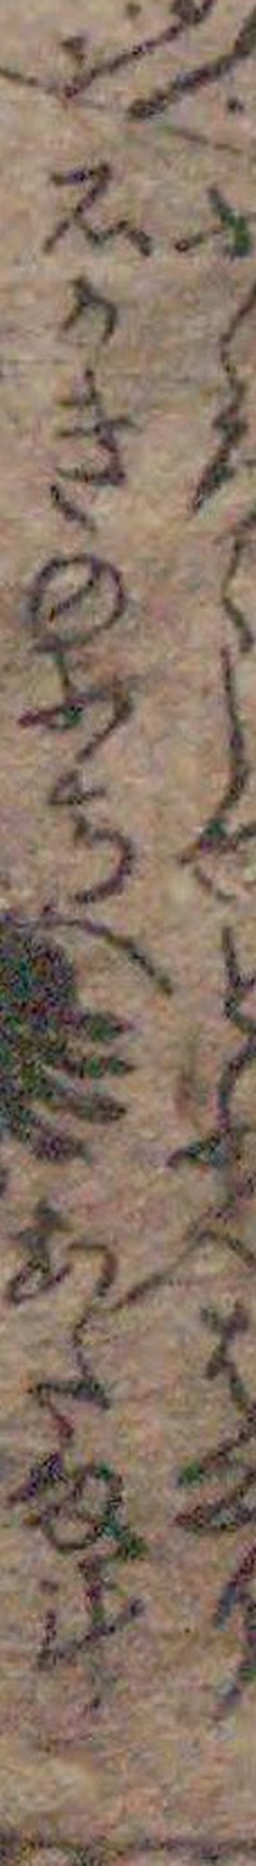石かきのふちへあたま斗
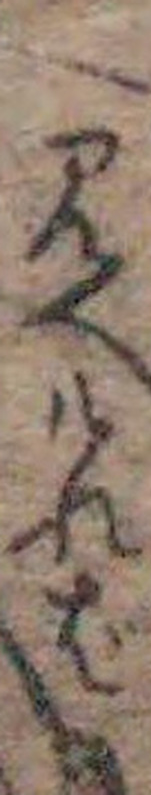見へければ
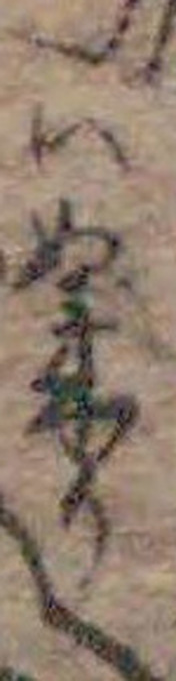いぬ来り
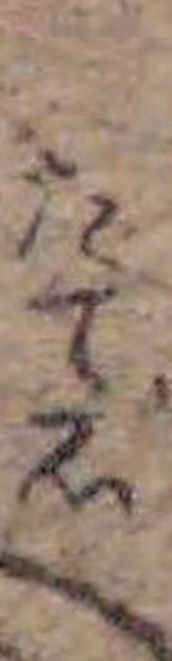たて石
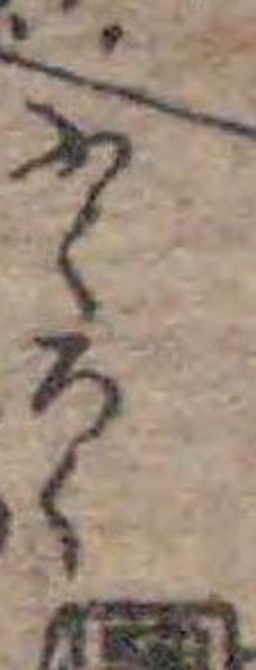ふくろく
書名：蛭子大黒壮年過 : 2巻
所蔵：国立国会図書館 National Diet Library, JAPAN
